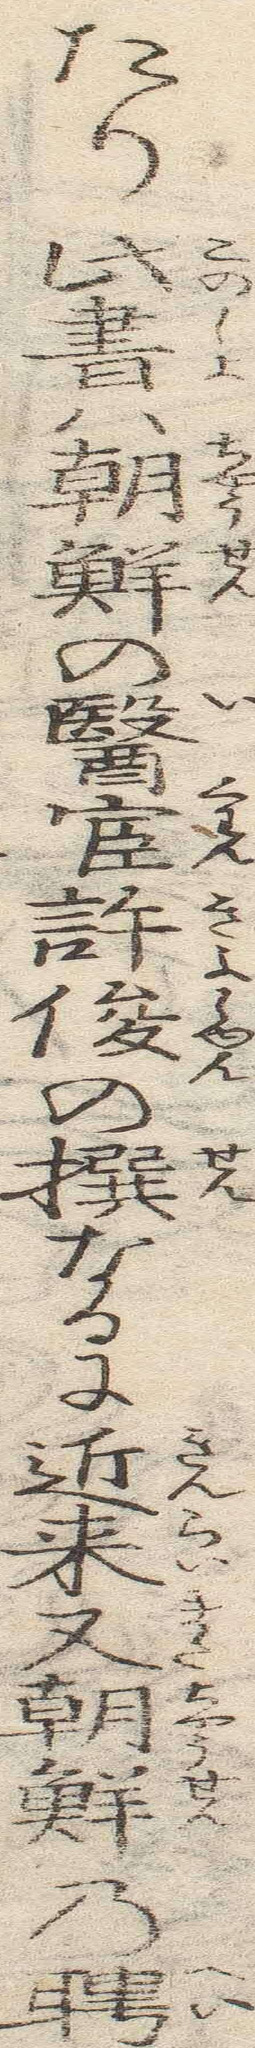たり此書は朝鮮の医宦許俊の撰なるに近来又朝鮮の聘
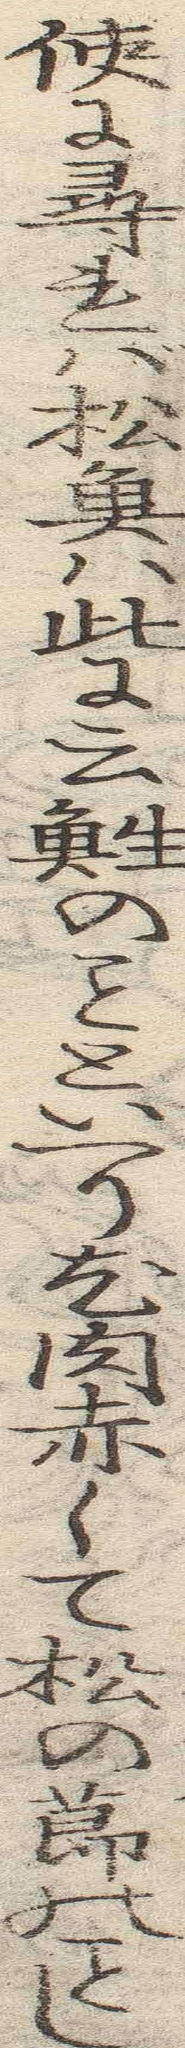使に尋れば松魚は此に云鮭のことといへり尤肉赤して松の節のことし
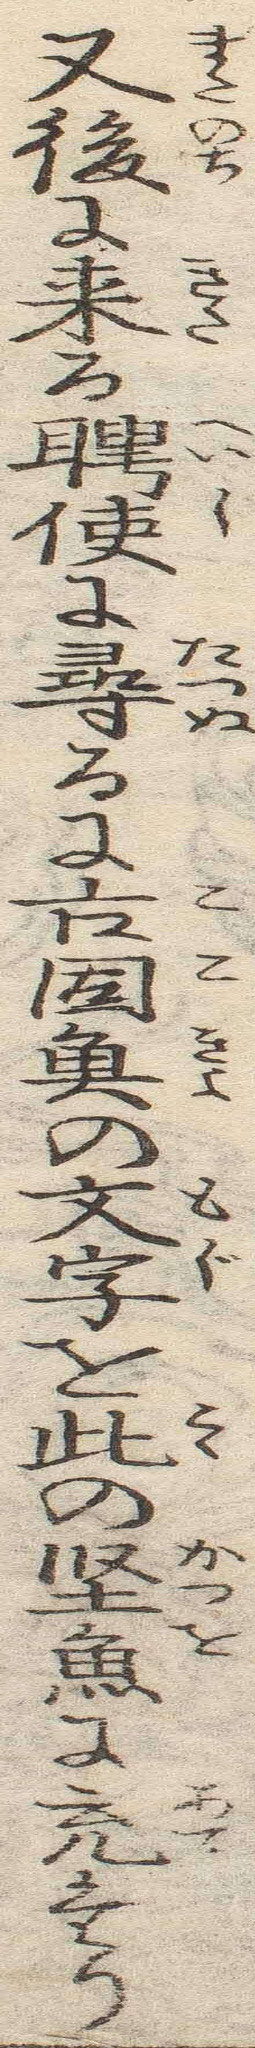又後に来る聘使に尋るに古固魚の文字を此の堅魚に充たり
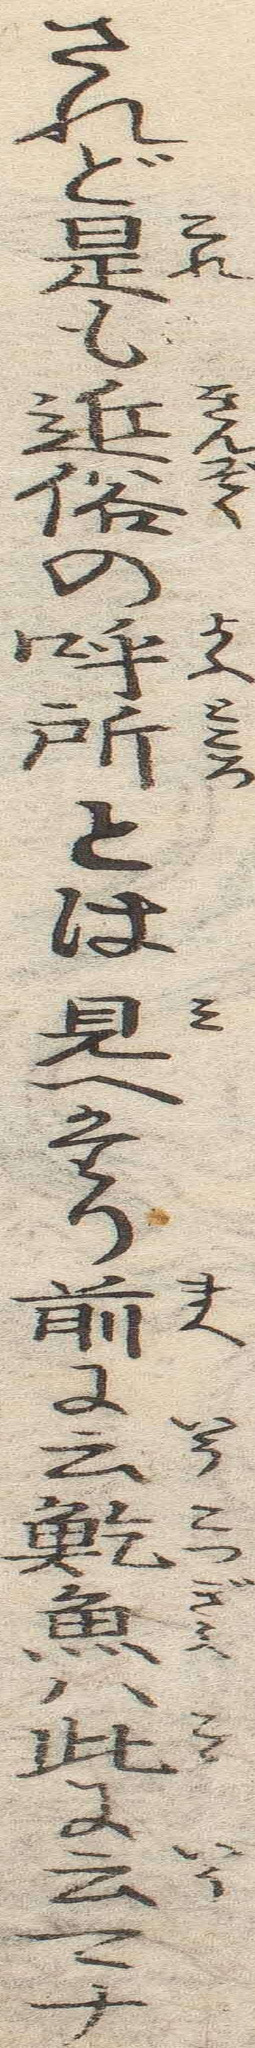されど是も近俗の呼所とは見へたり前に云䰴魚は此に云マナ
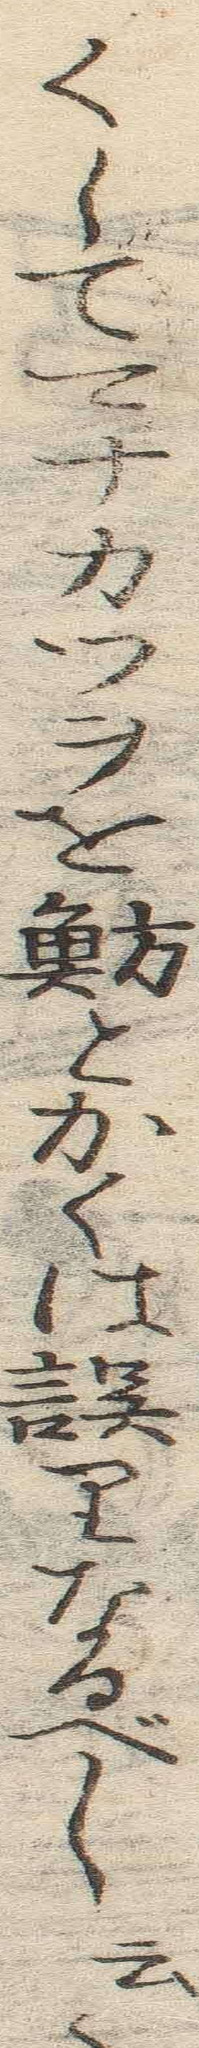くしてマナカツヲを魴とかくは誤りなるべし云々
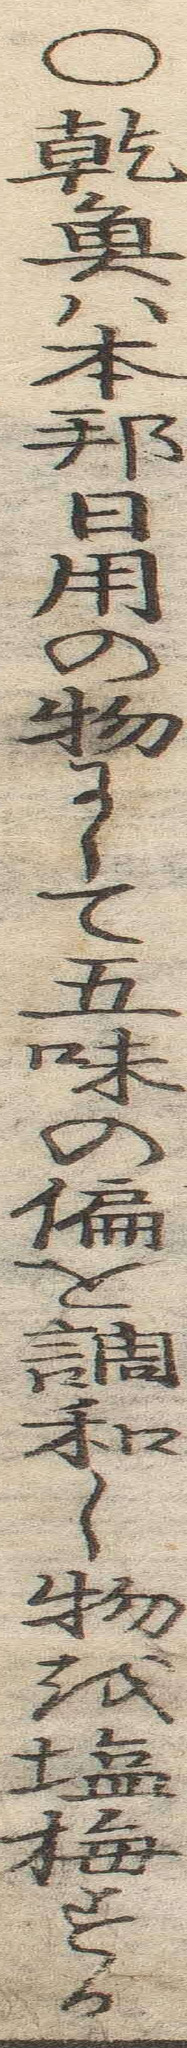○乾魚は本邦日用の物にして五味の偏を調和し物を塩梅する
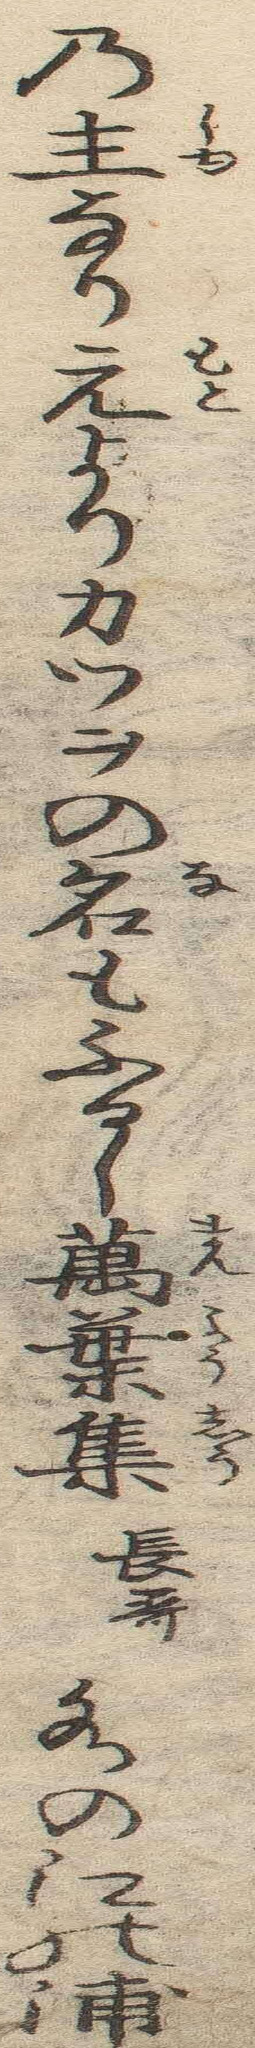の主なり元よりカツヲの名もふるし万葉集長哥水の江の浦

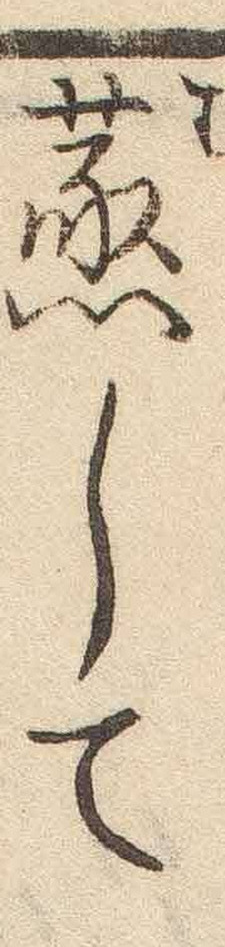蒸して
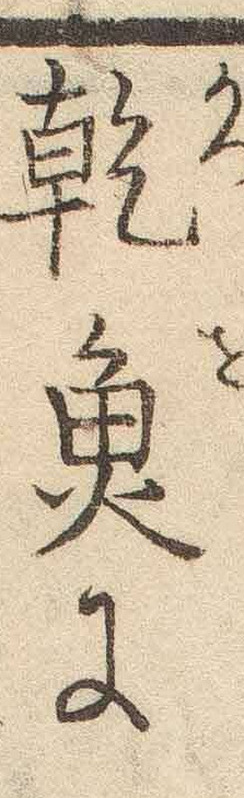乾魚に

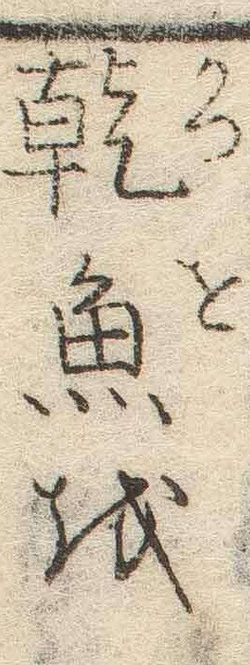乾魚を

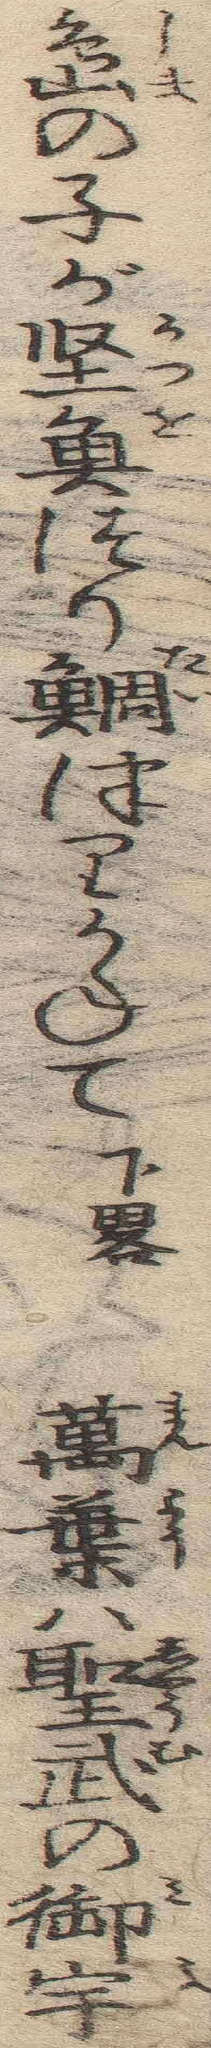島の子が堅魚つり鯛つりかねて下略万葉は聖武の御宇
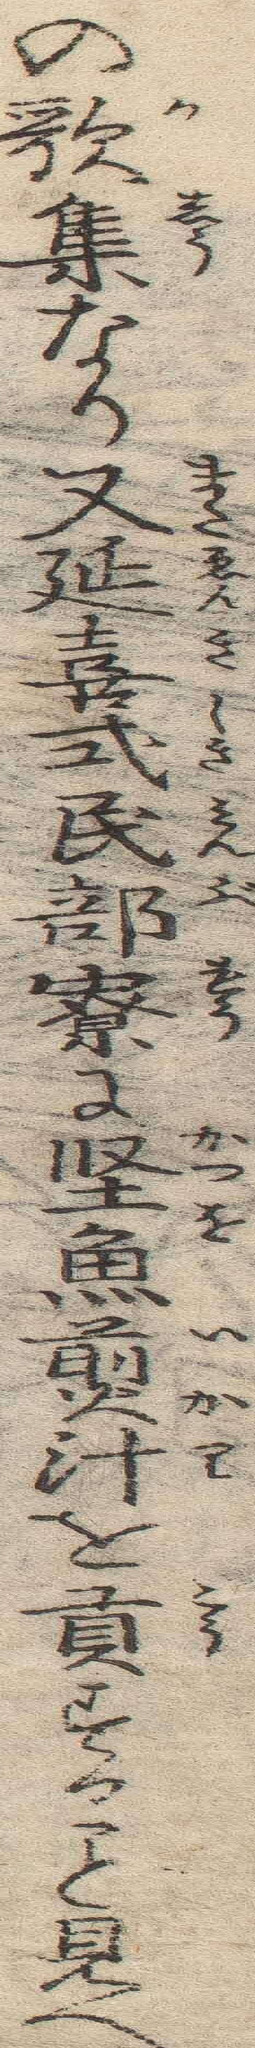の歌集なり又延喜式民部寮に堅魚煎汁を貢すること見へ
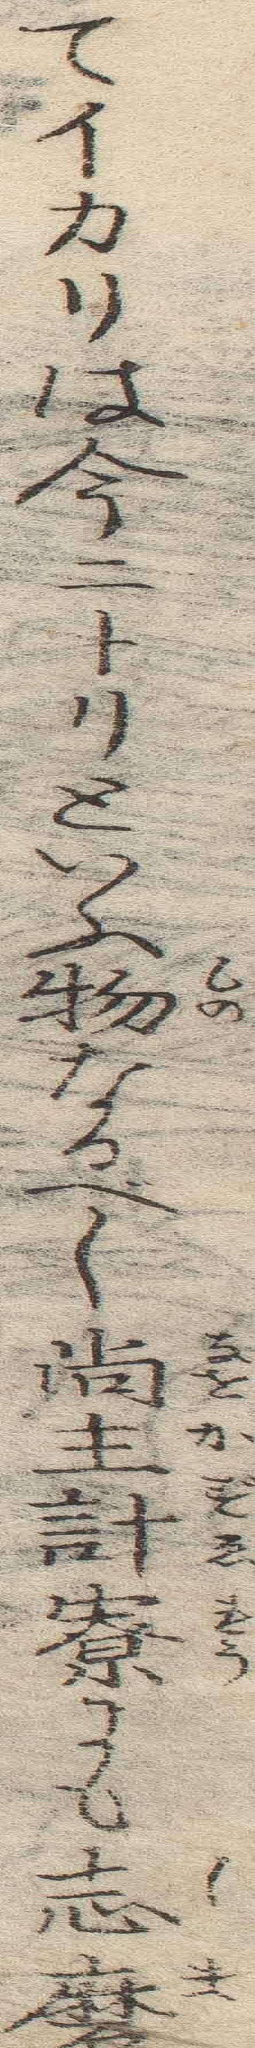てイカリは今ニトリといふ物なるべし尚主計寮にも志磨
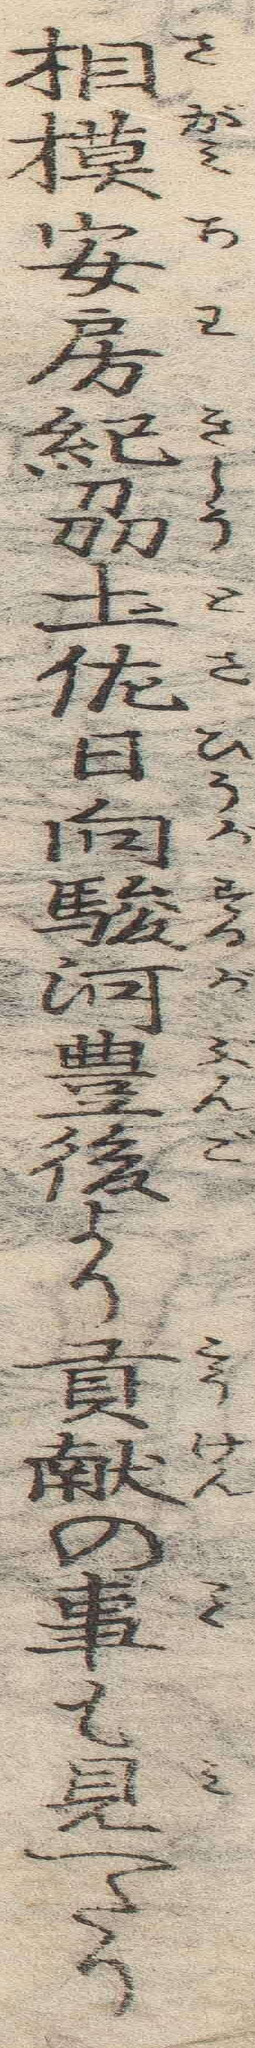相模安房紀州土佐日向駿河豊後より貢献の事も見へたり
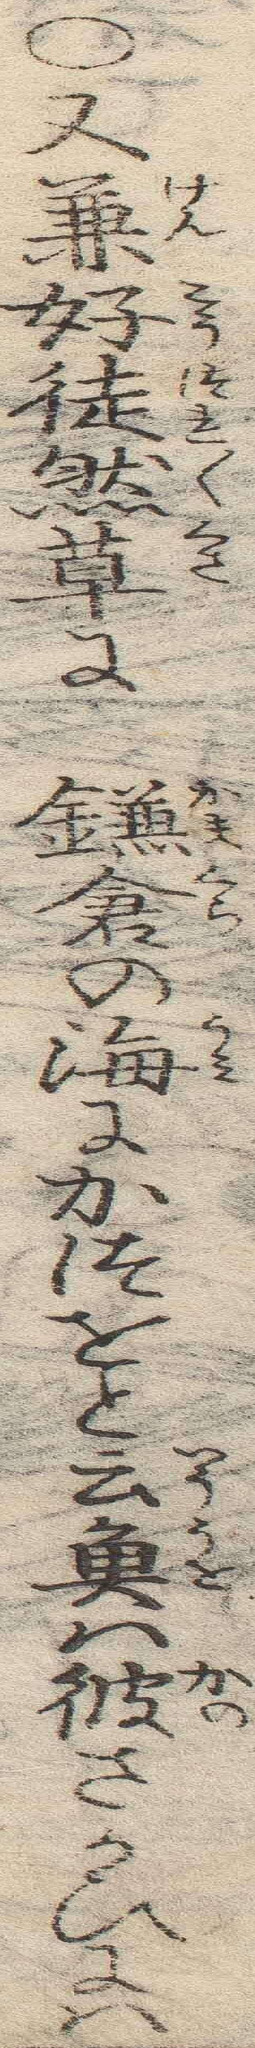○又兼好徒然草に鎌倉の海にかつをと云魚は彼さかひには
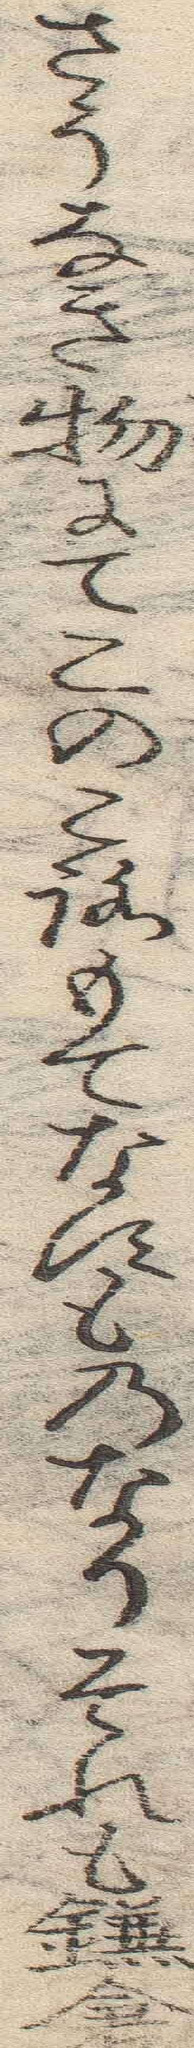さうなき物にてこのころもてなすものなりそれも鎌倉
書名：日本山海名産図会
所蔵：東京学芸大学附属図書館 国文学研究資料館
